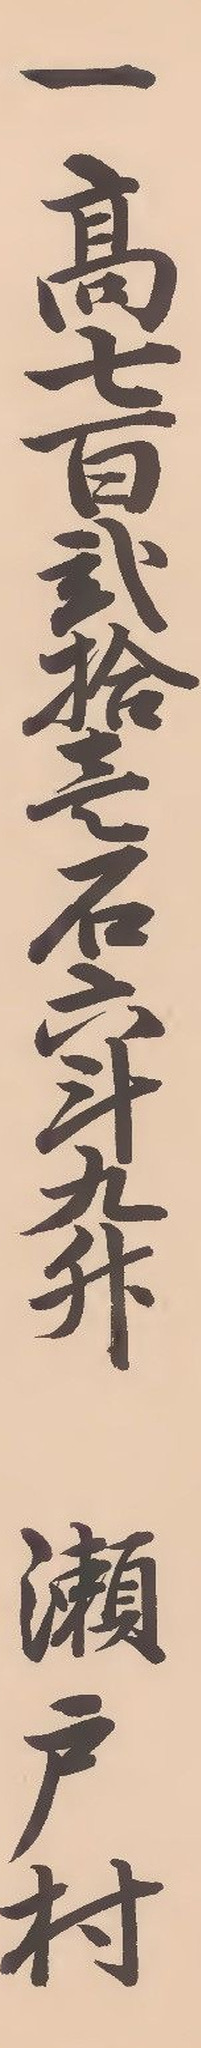一高七百弐拾壱石六斗九升瀬戸村
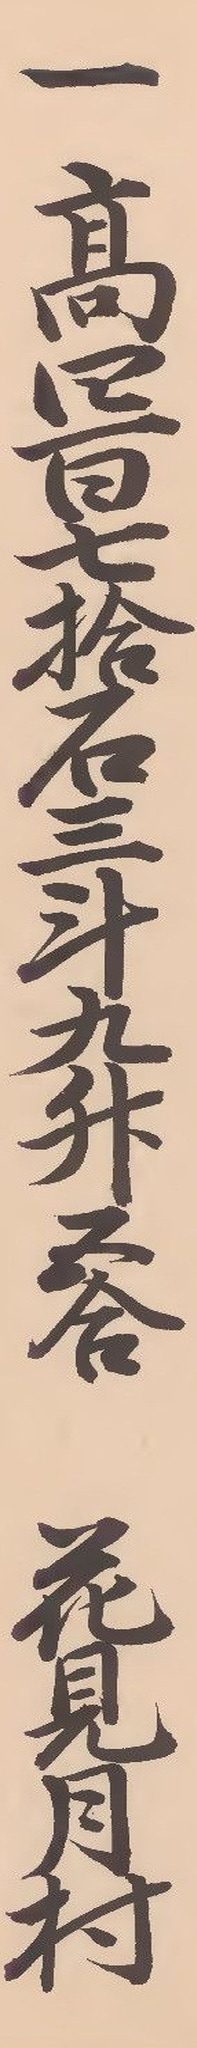一高四百七拾石三斗九升五合花見月村

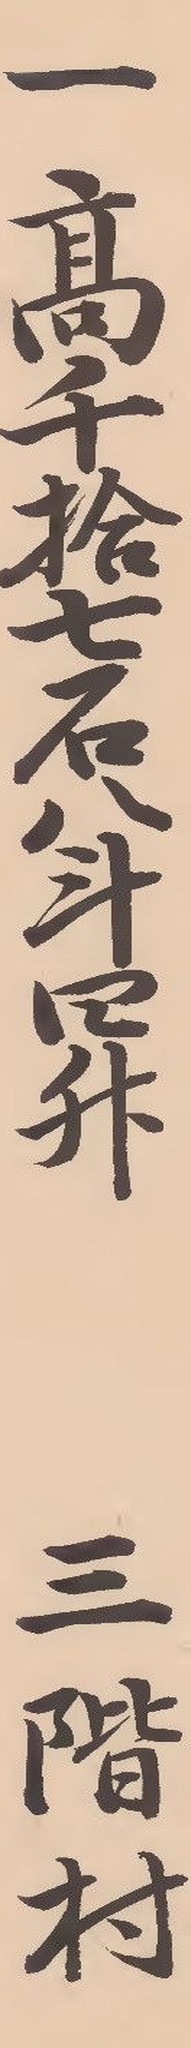一高千拾七石八斗四升三階村
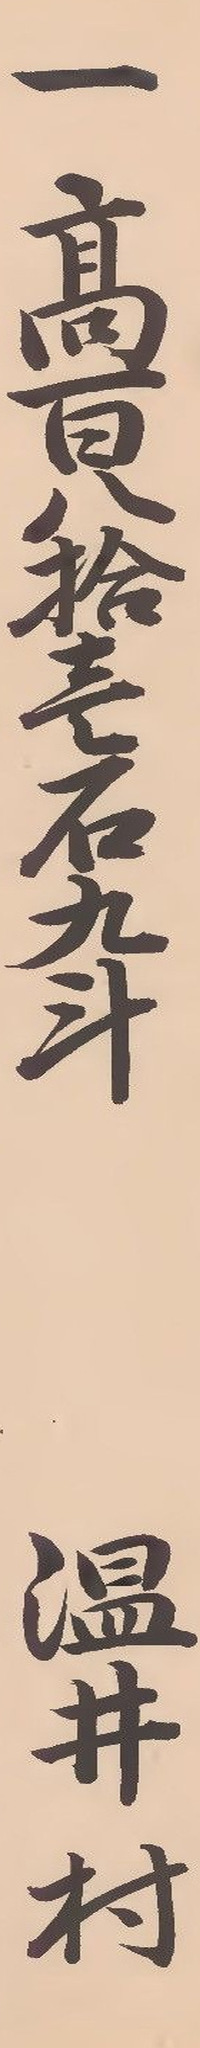一高百八拾壱石九斗温井村
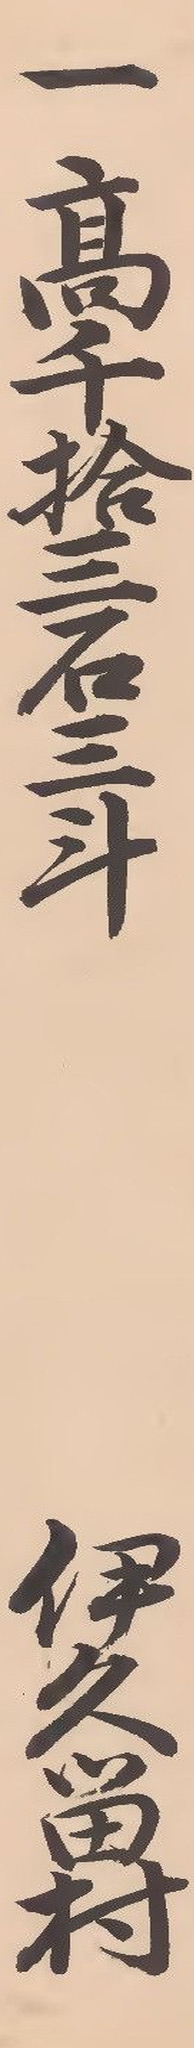一高千拾三石三斗伊久留村
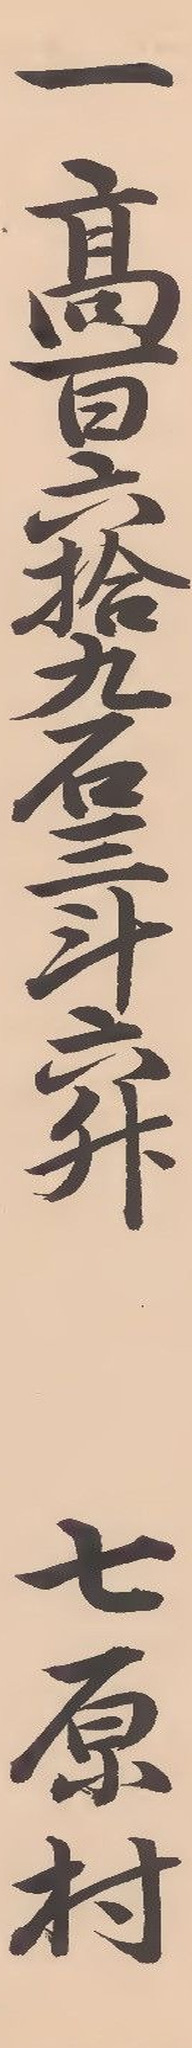一高百六拾九石三斗六升七原村
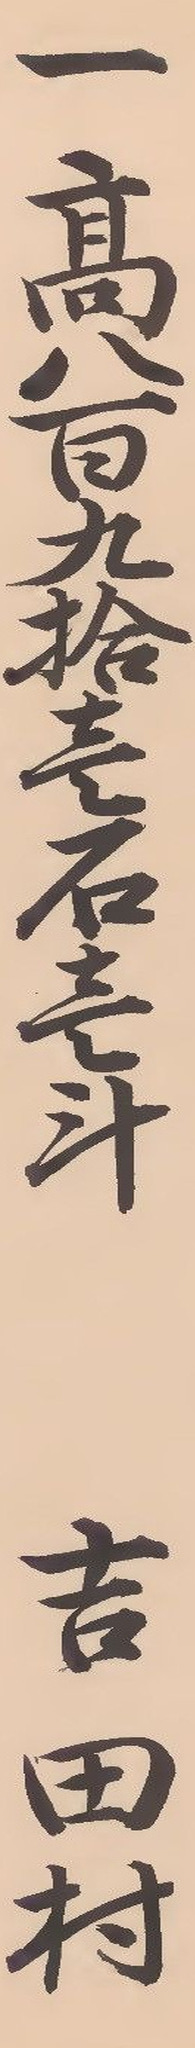一高八百九拾壱石壱斗吉田村

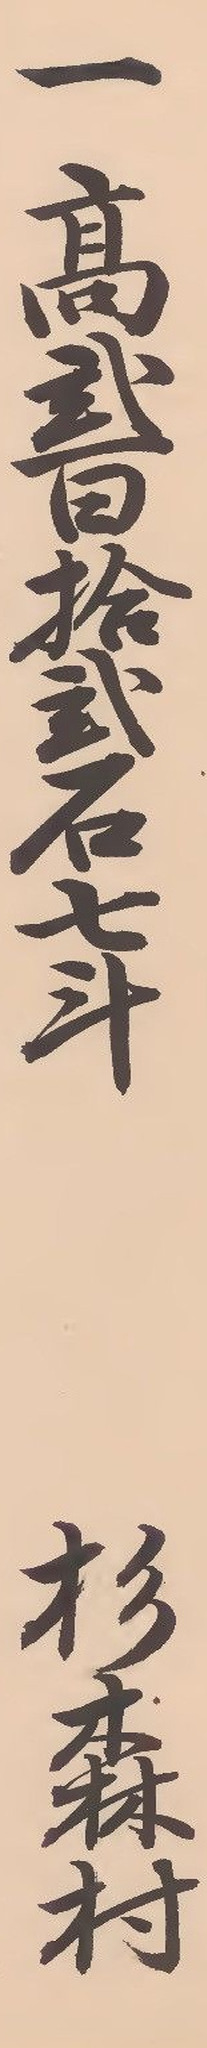一高弐百拾弐石七斗杉森村
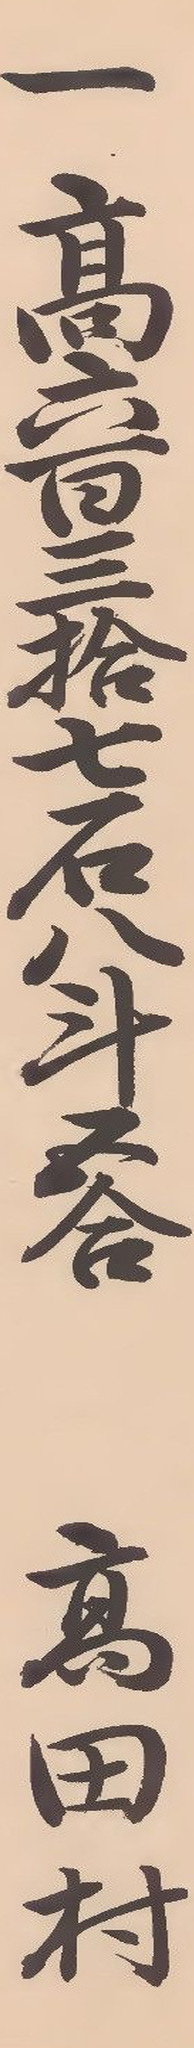一高六百三拾七石八斗五合高田村
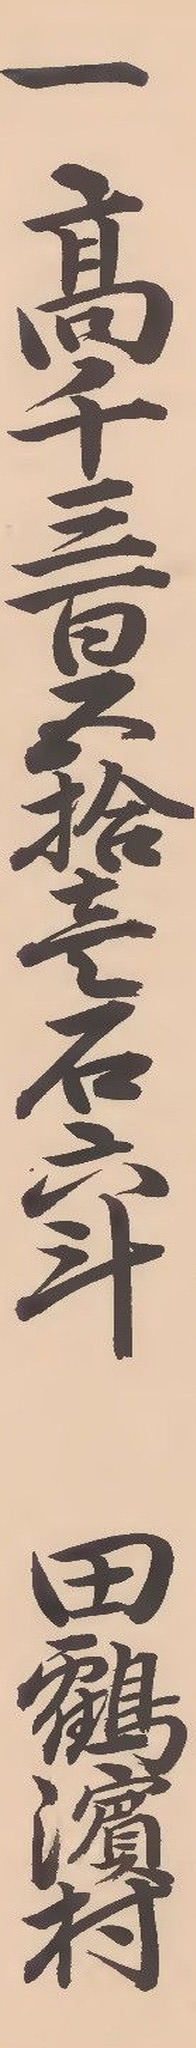一高千三百五拾壱石六斗田鶴浜村
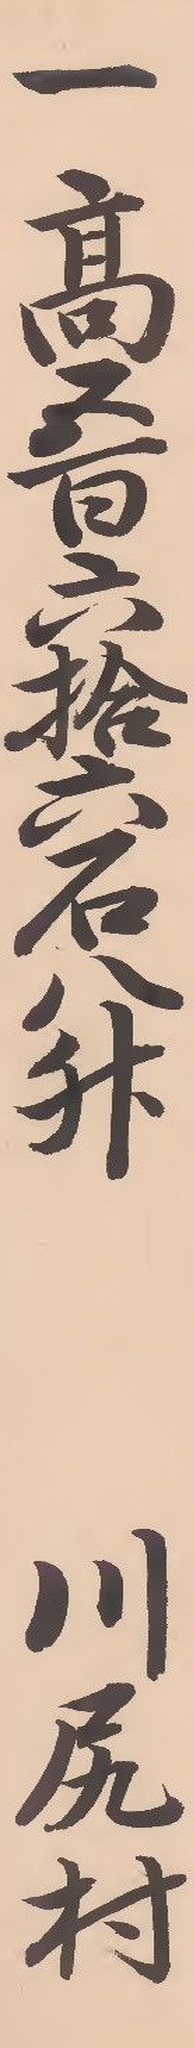一高五百六拾六石八升川尻村
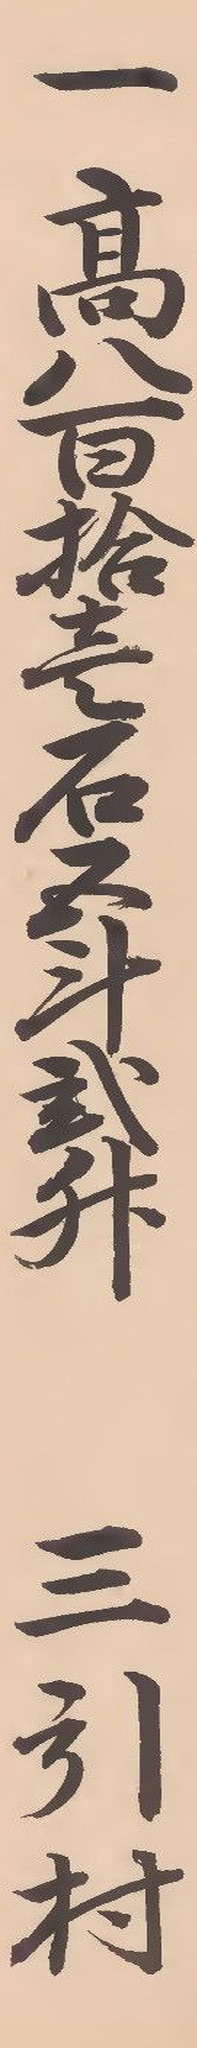一高八百拾壱石五斗弐升三引村
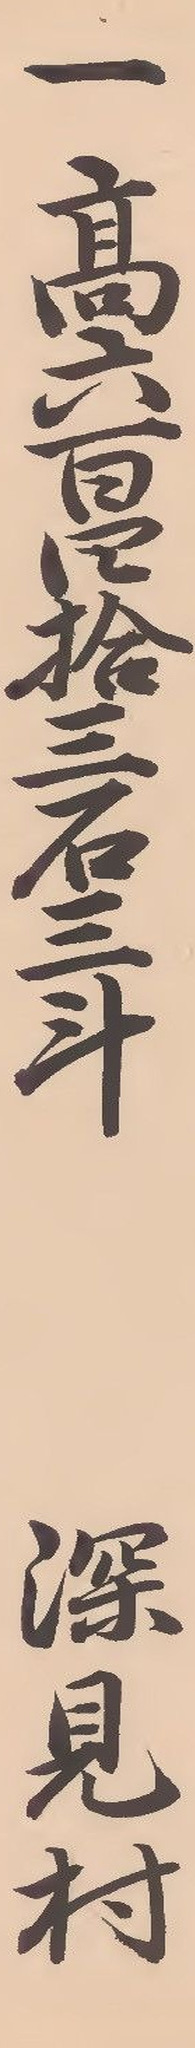一高六百四拾三石三斗深見村
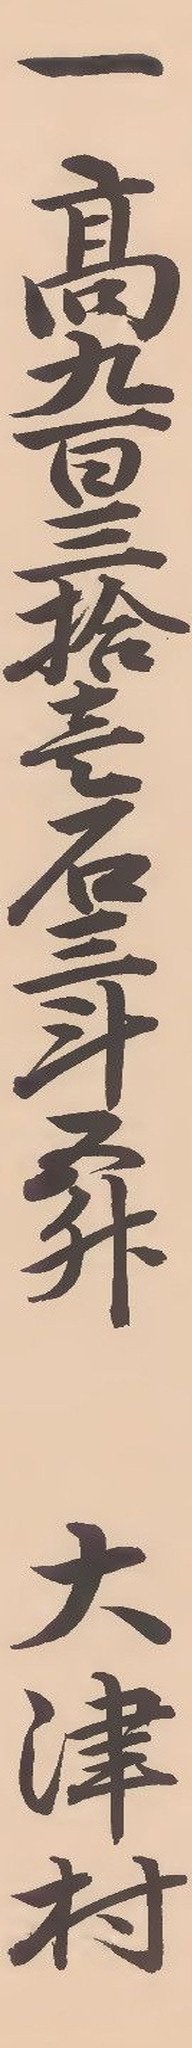一高九百三拾壱石三斗五升大津村

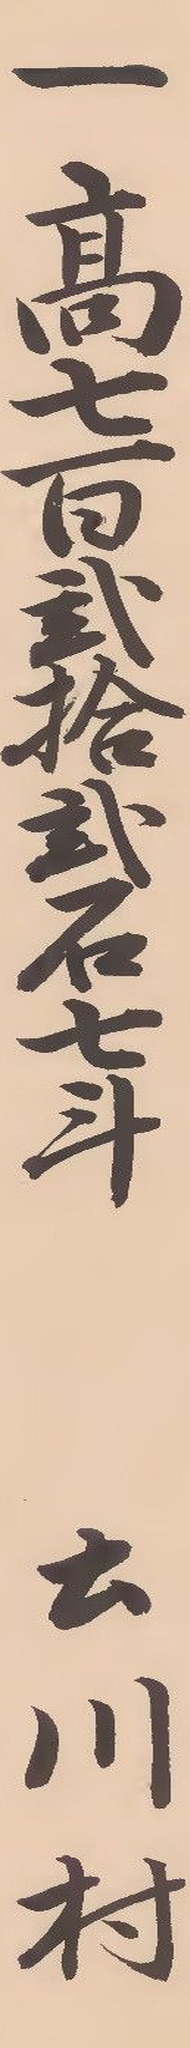一高七百弐拾弐石七斗土川村
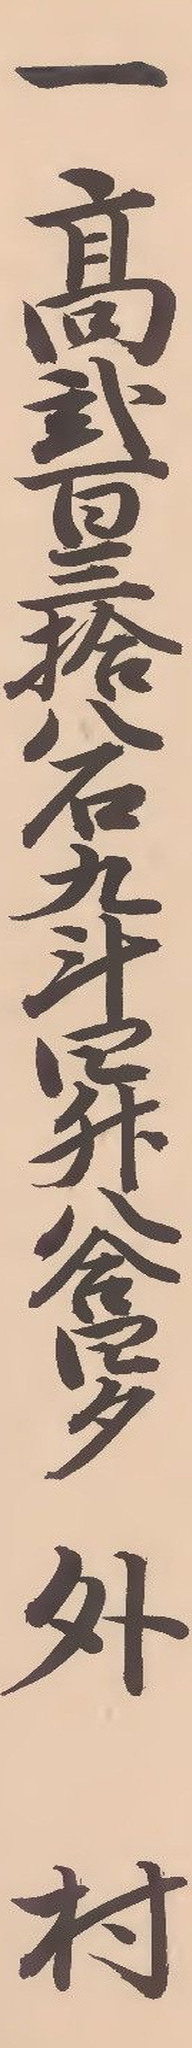一高弐百三拾八石九斗四升八合四勺外村
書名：能登国郷帳
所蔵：国立公文書館 National Archives of Japan
